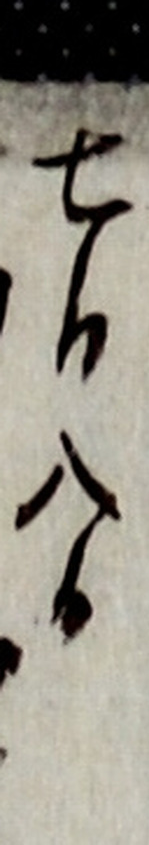七月八日
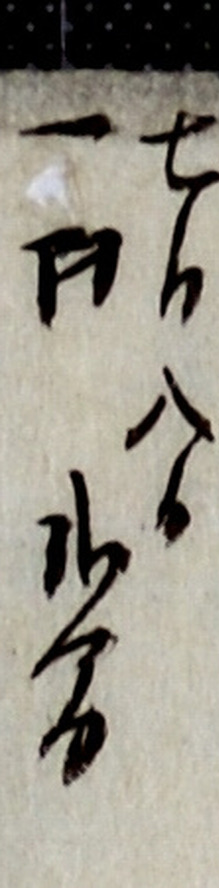一同三間
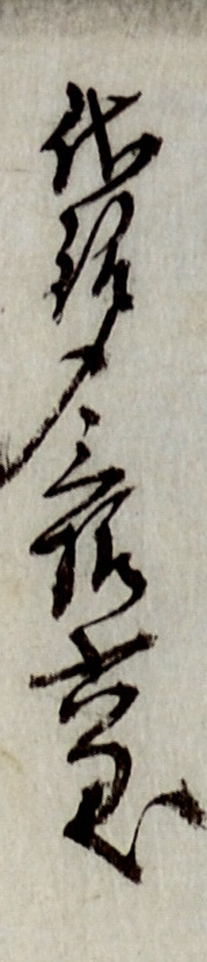代銀〆三拾六匁
